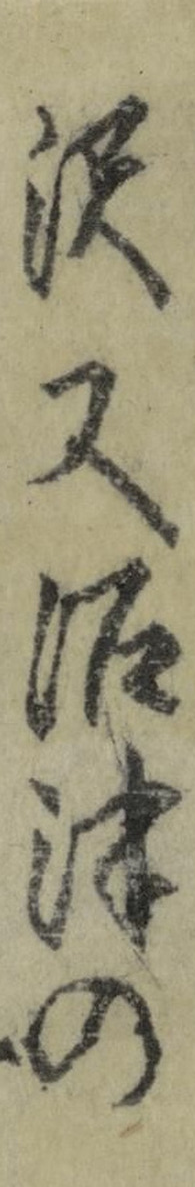澤又沼津の
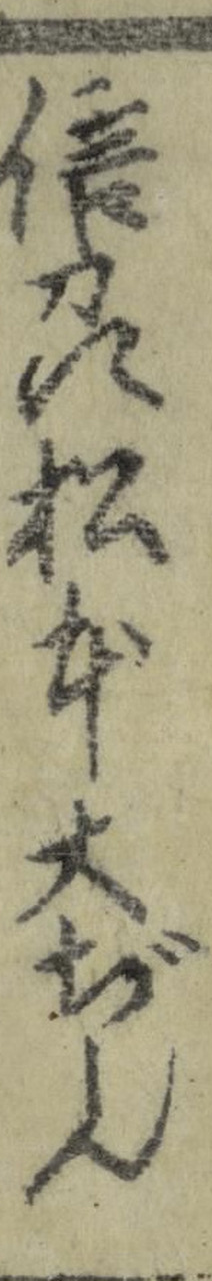信州松本大ぢしん
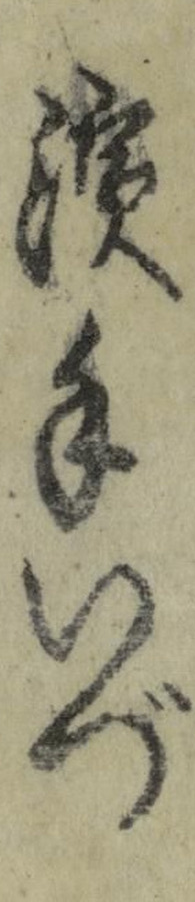濱手いづ
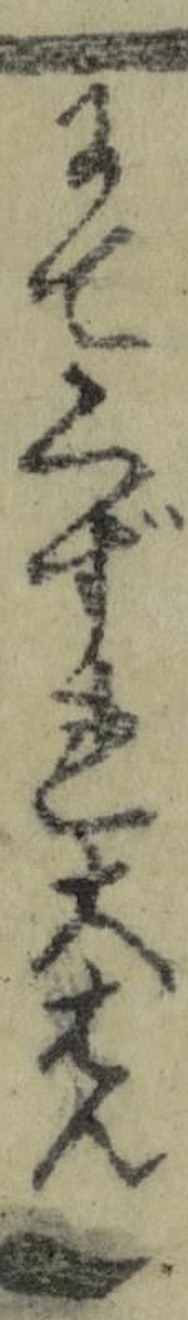にてくずれ大はん
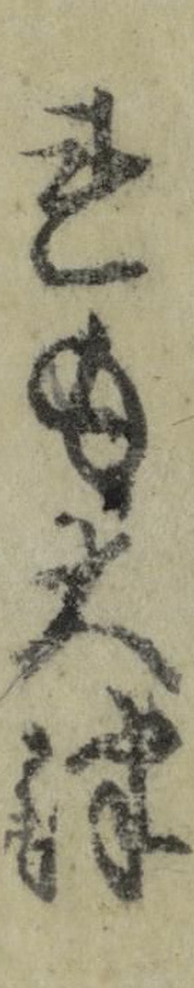れも大津
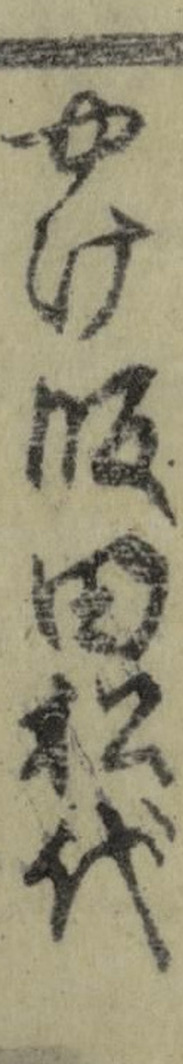やけ飯田松代
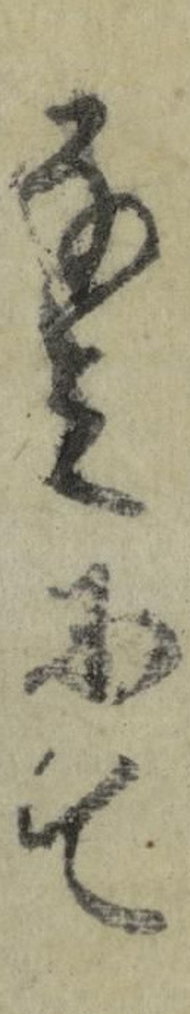なみにて
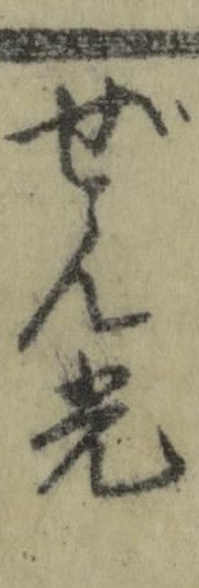ぜん光
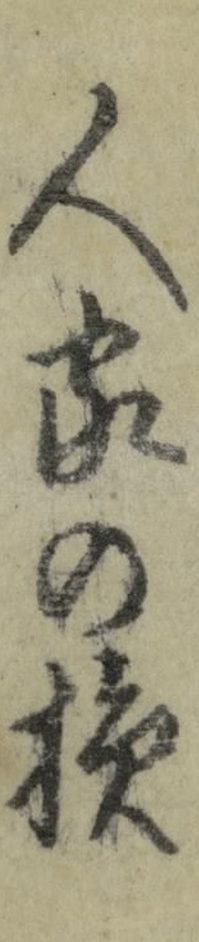人家の損
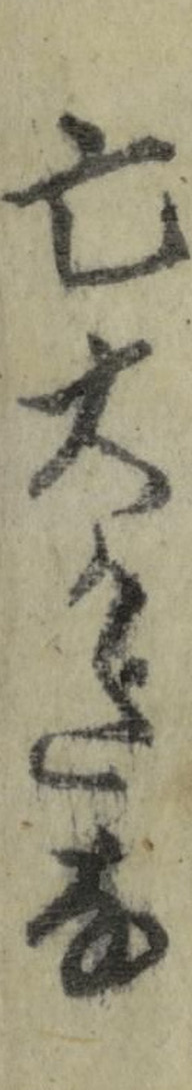亡大かたな
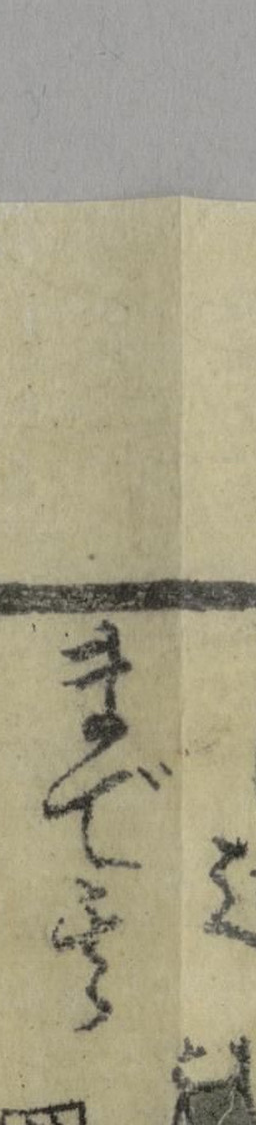まで其
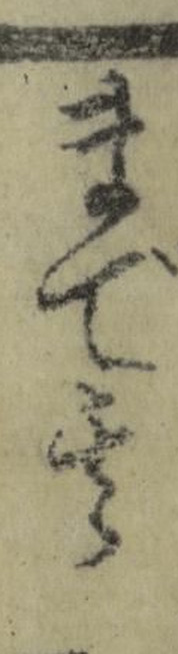まで其
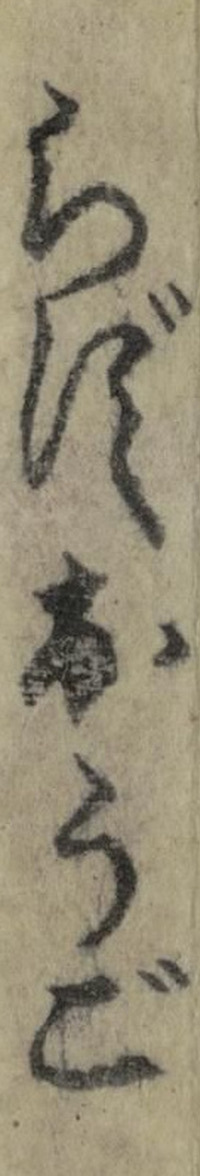らずおうご
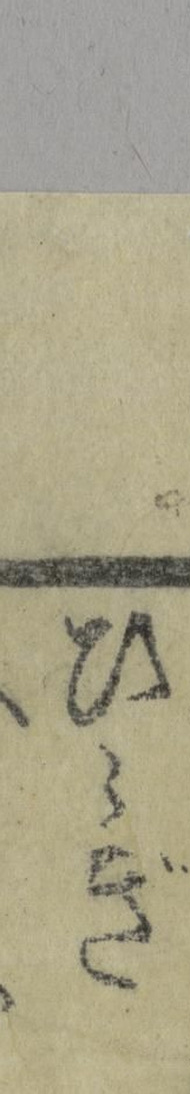ひゝぎ
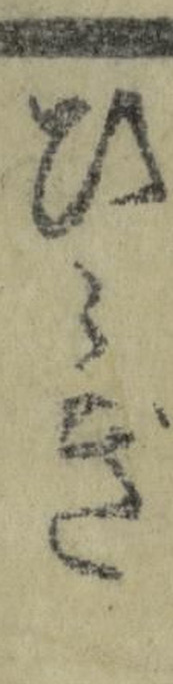ひゝぎ
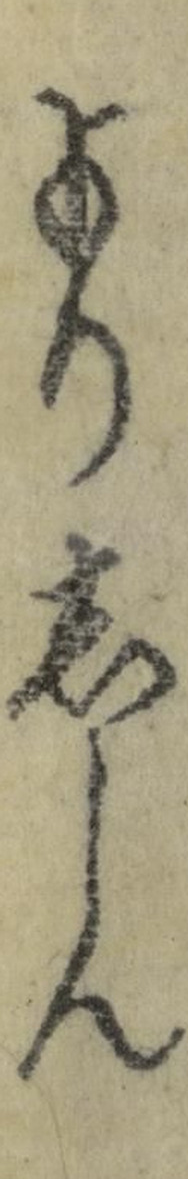よりししん
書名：[安政東南海地震に関する瓦版]
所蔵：東京大学地震研究所図書室 Earthquake Research Institute Library, The University of Tokyo, JAPAN
